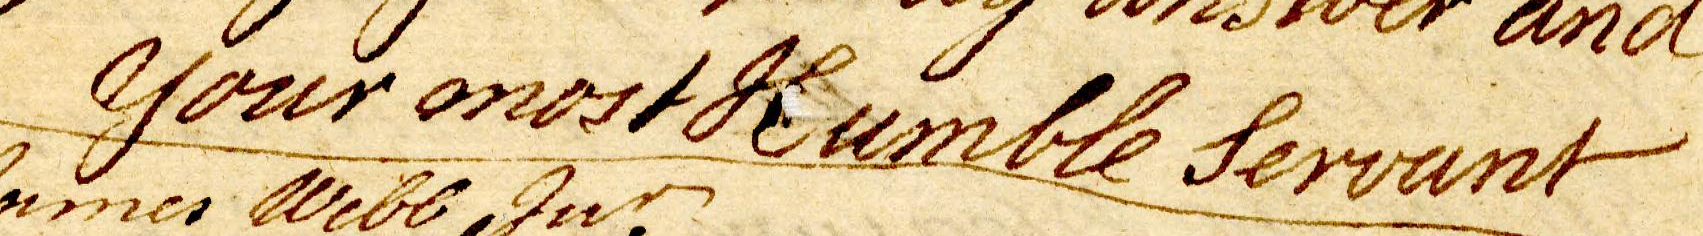Your most Humble Servant
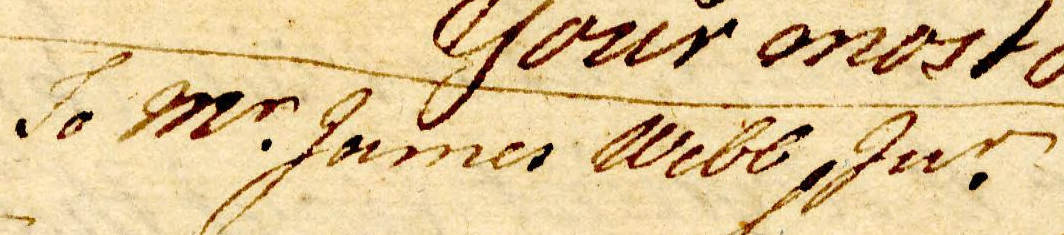To M^r. James Webb Ju^r.
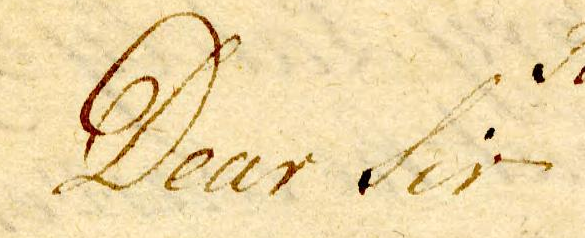Dear Sir
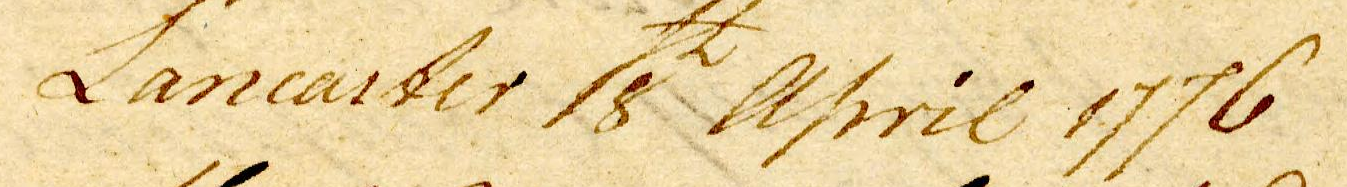Lancaster 18^th April 1776
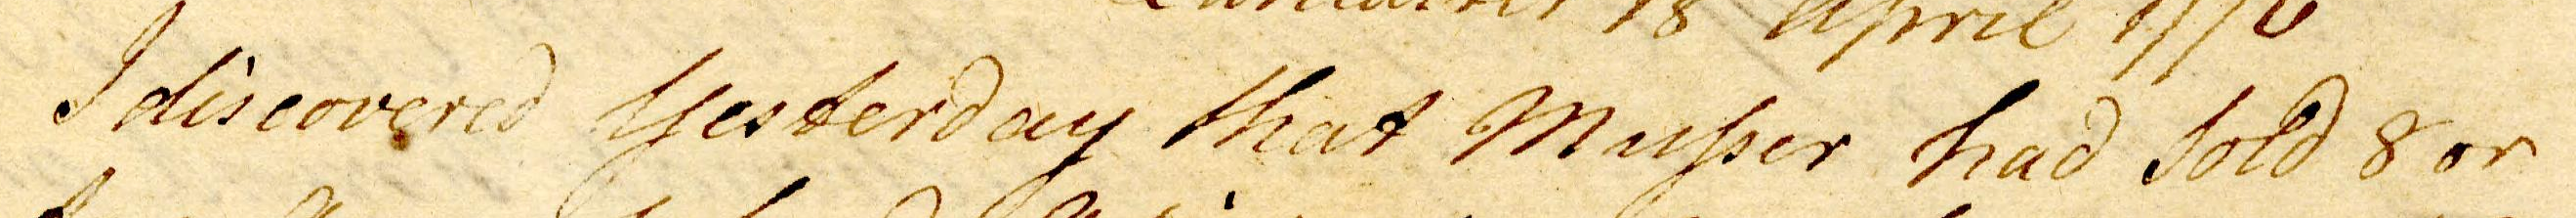I discovered Yesterday that Musser had sold 8 or
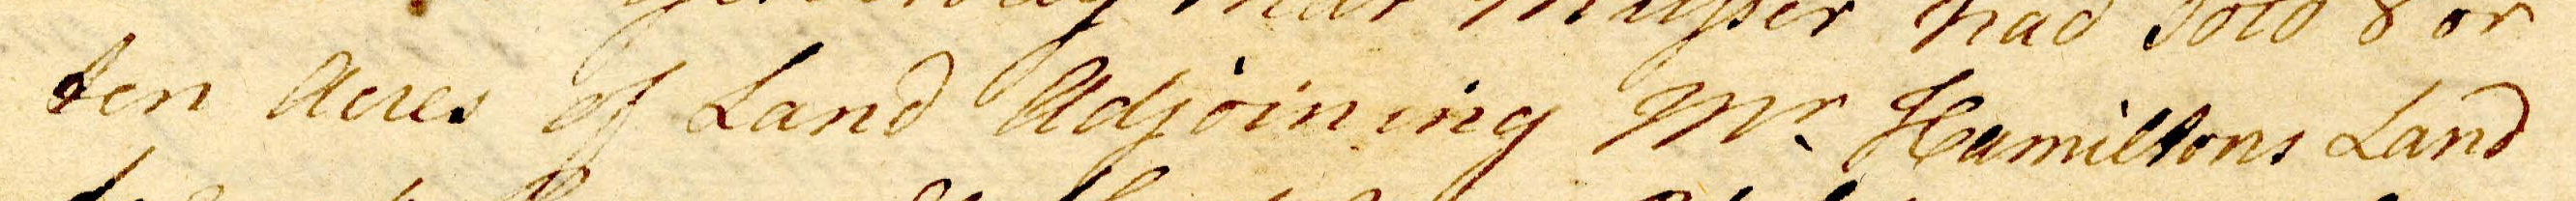ten Acres of Land Adjoining M^r. Hamiltons Land
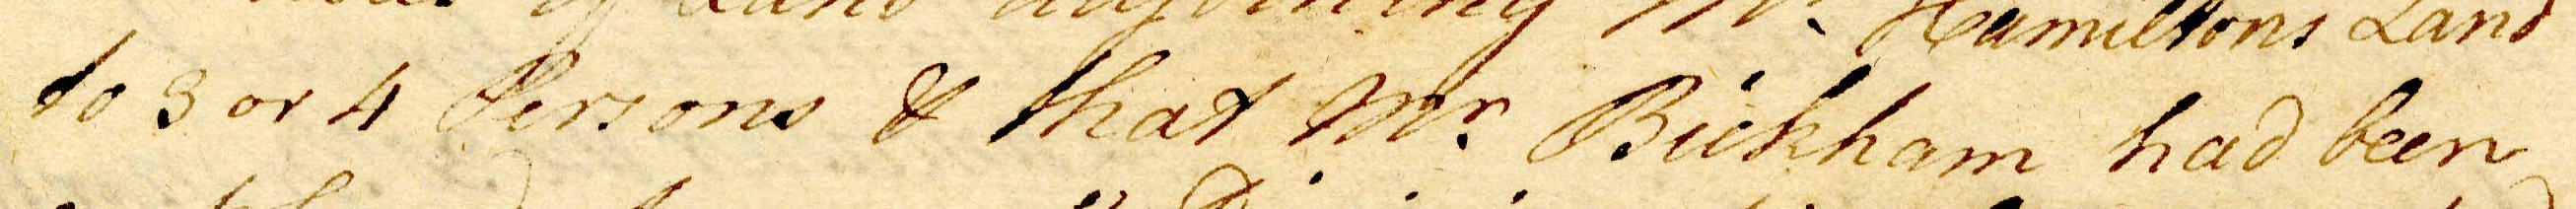to 3 or 4 Persons & that M^r. Bickham had been
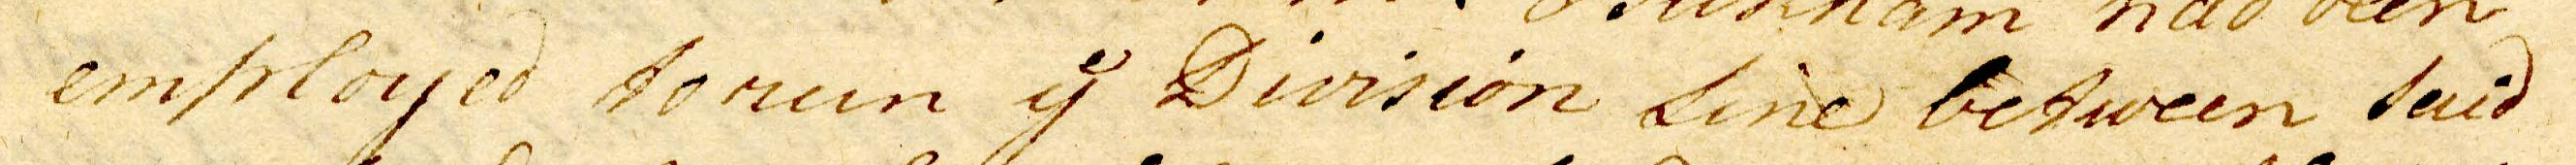employed do run y^e Division Line between said
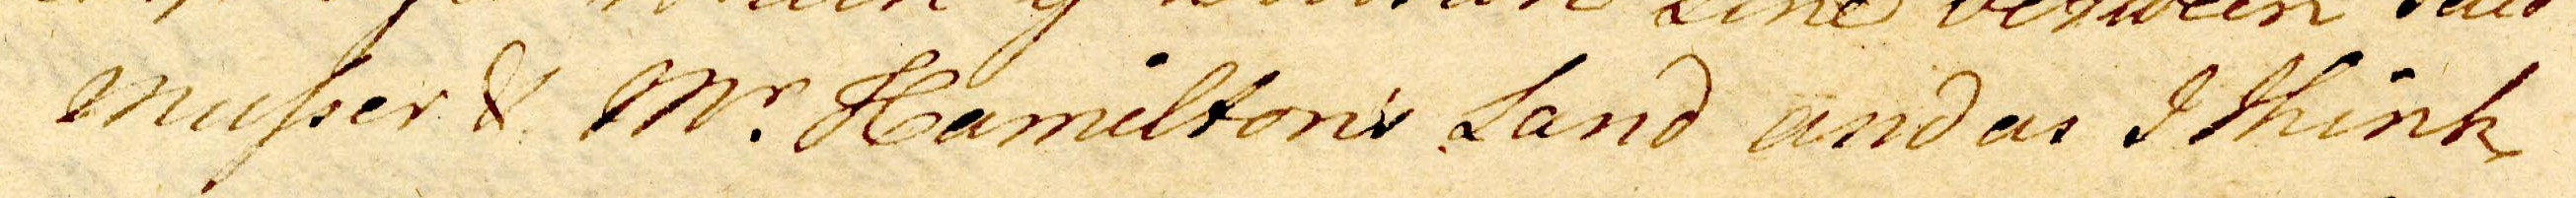Musser & M^r. Hamilton's Land and as I think
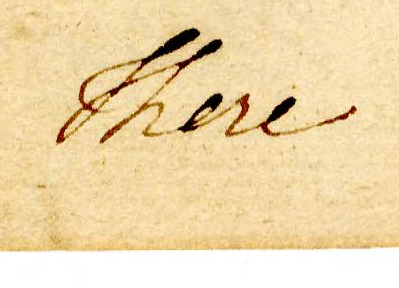there
